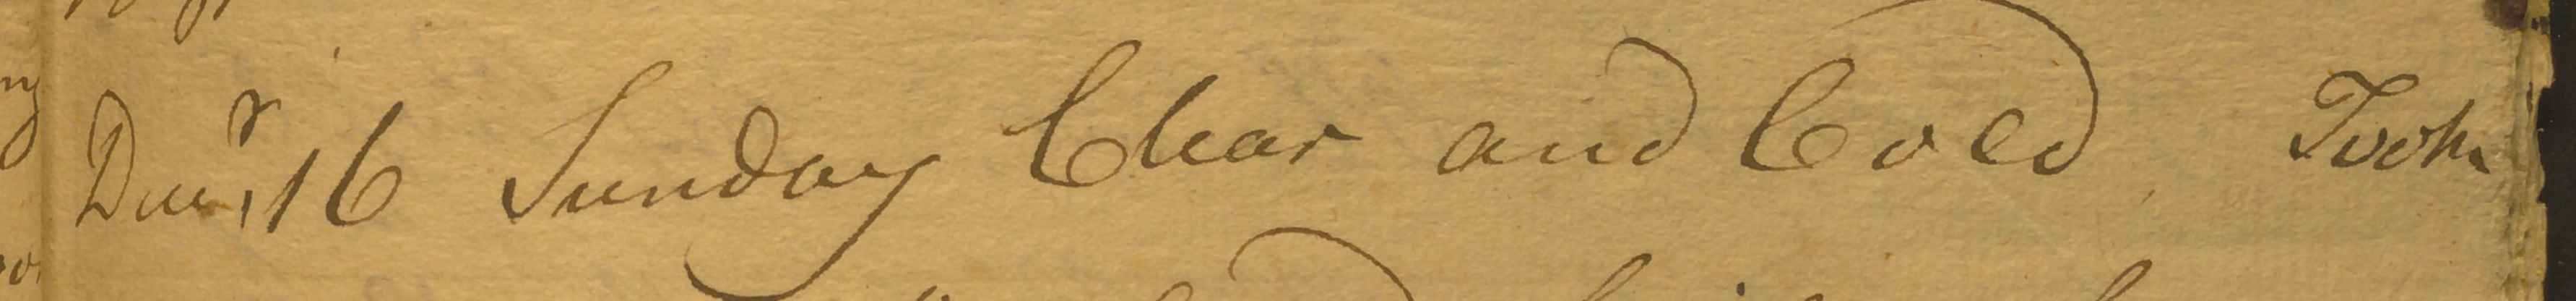Dec^r. 16 Sunday Clear and Cold Took
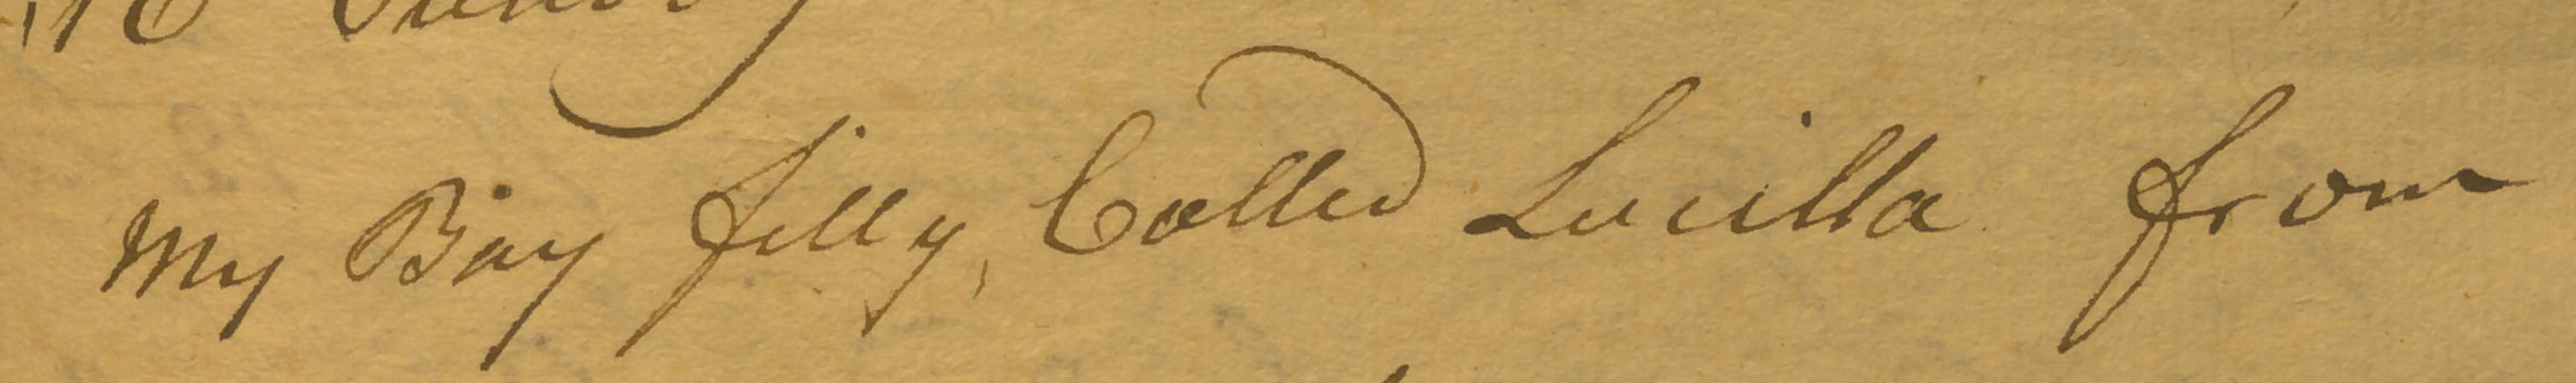My Bay filly Called Lucilla, from
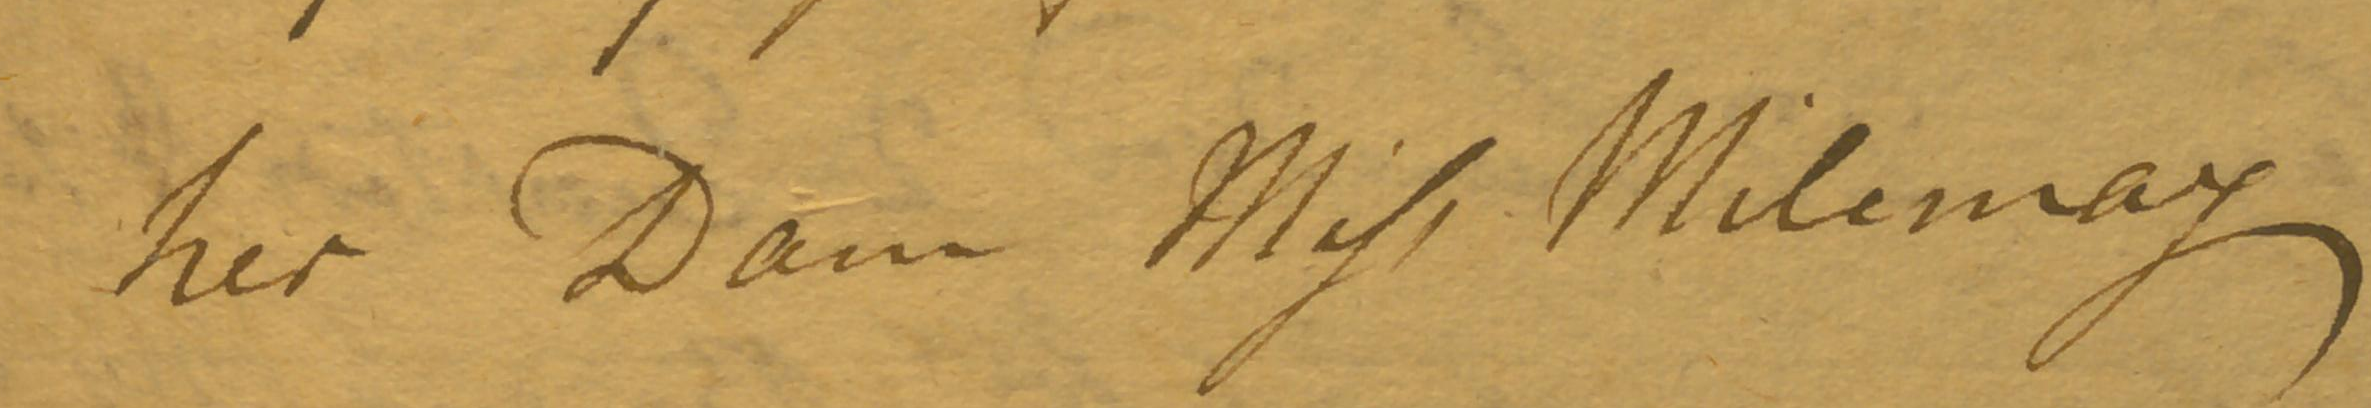her Dam Miss Milemay
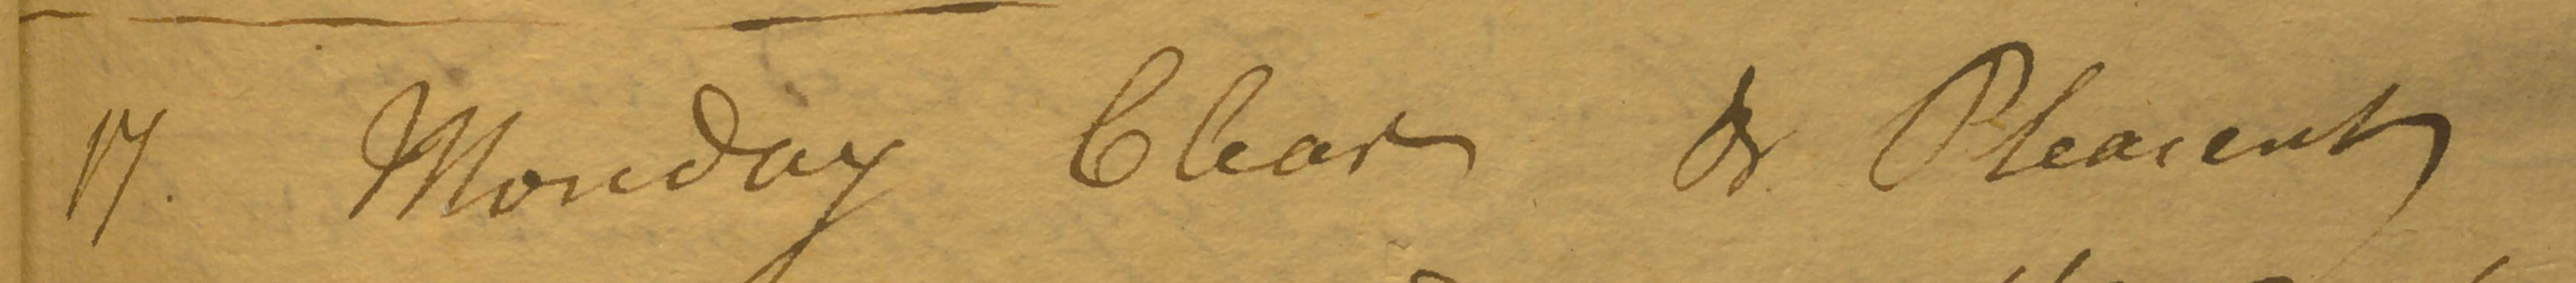17. Monday Clear & Pleasent
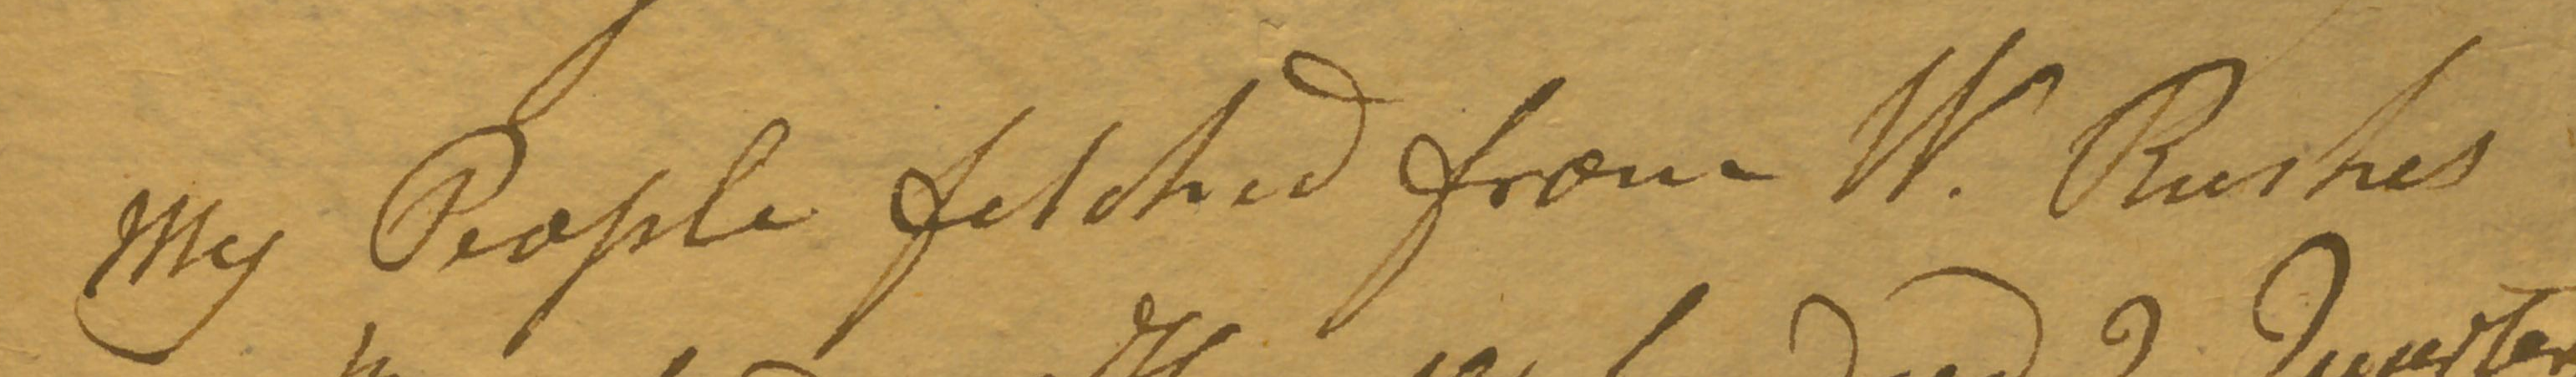My People fetched from W. Rushes
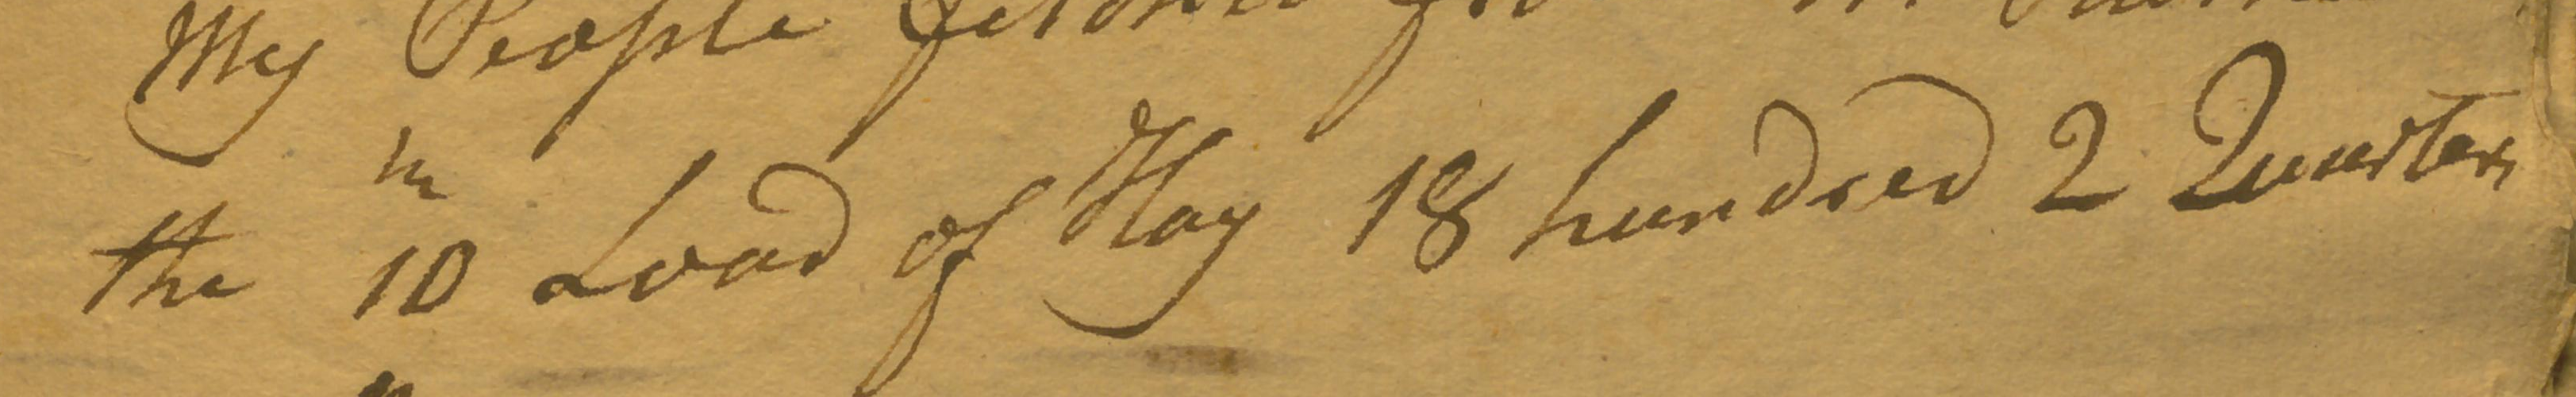the 10^th Load of Hay 18 hundred 2 Quarters
